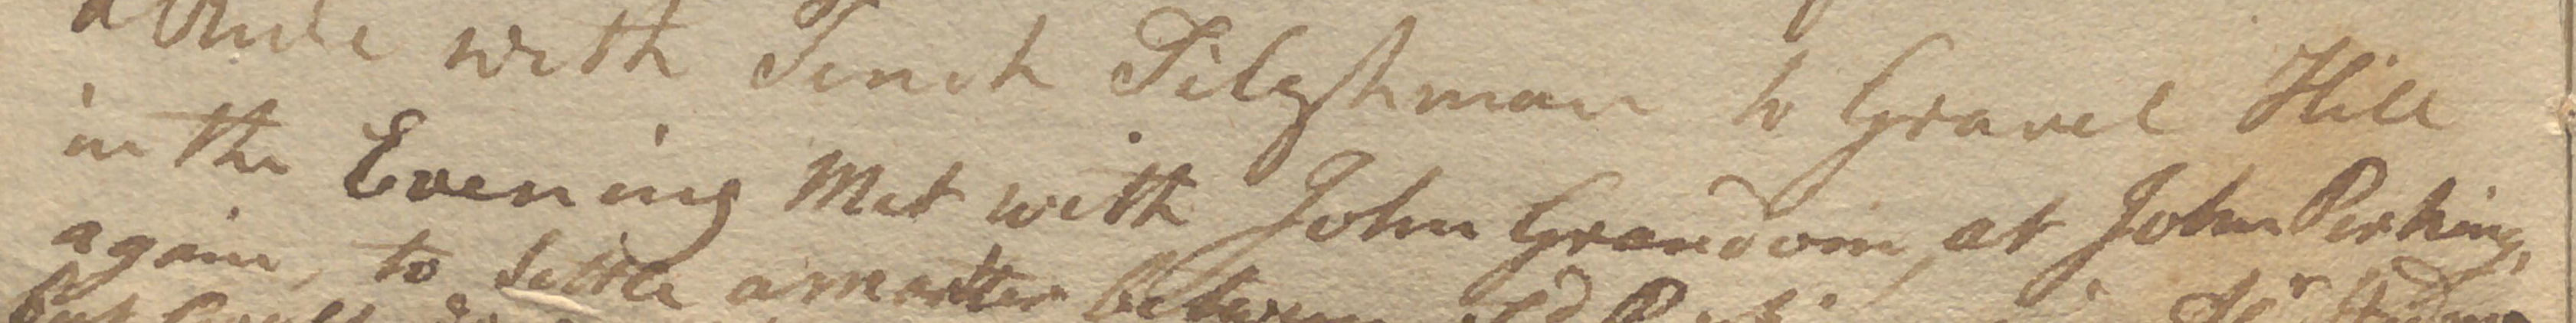in the Evening Met with John Grandom at John Perkins,
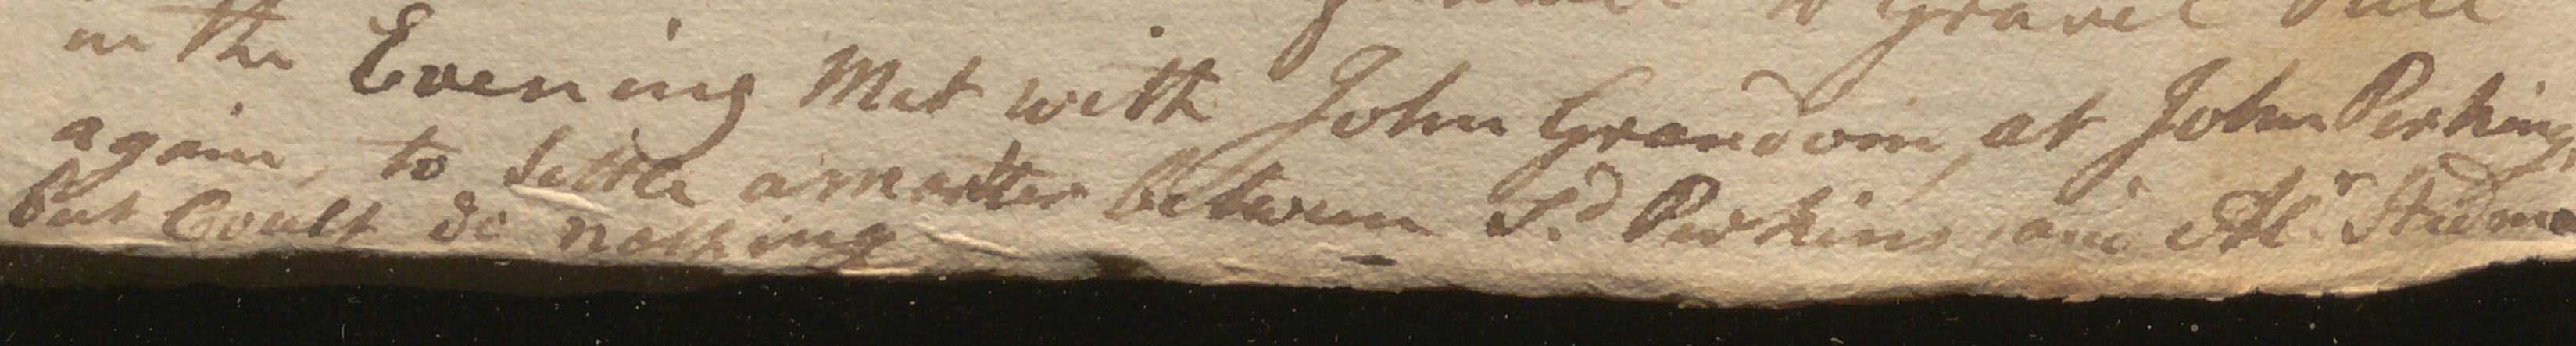again, to settle a matter between s^d. Perkins and Al^r Stedman
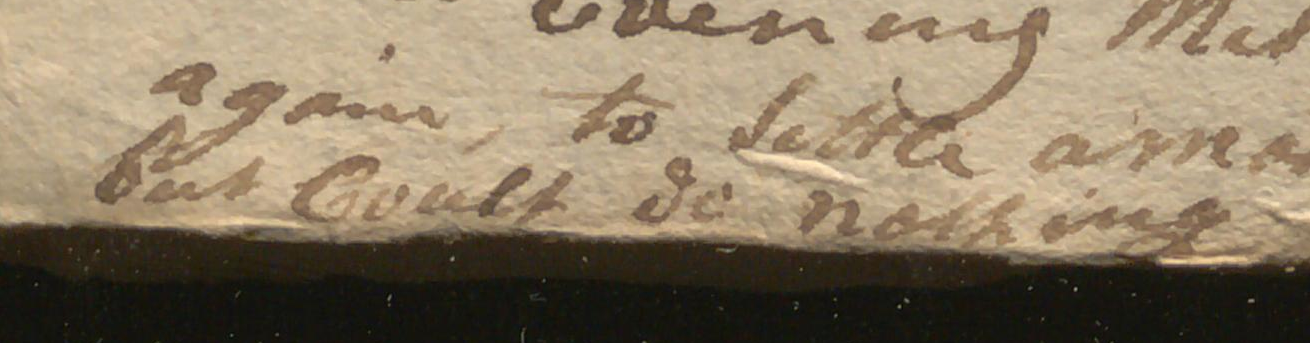but Coult do nothing
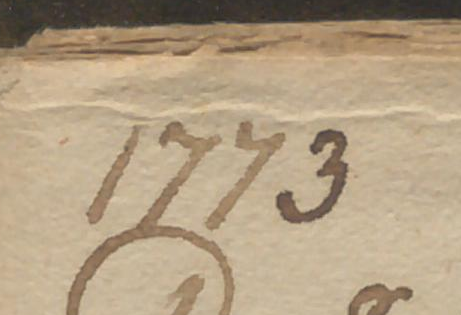1773
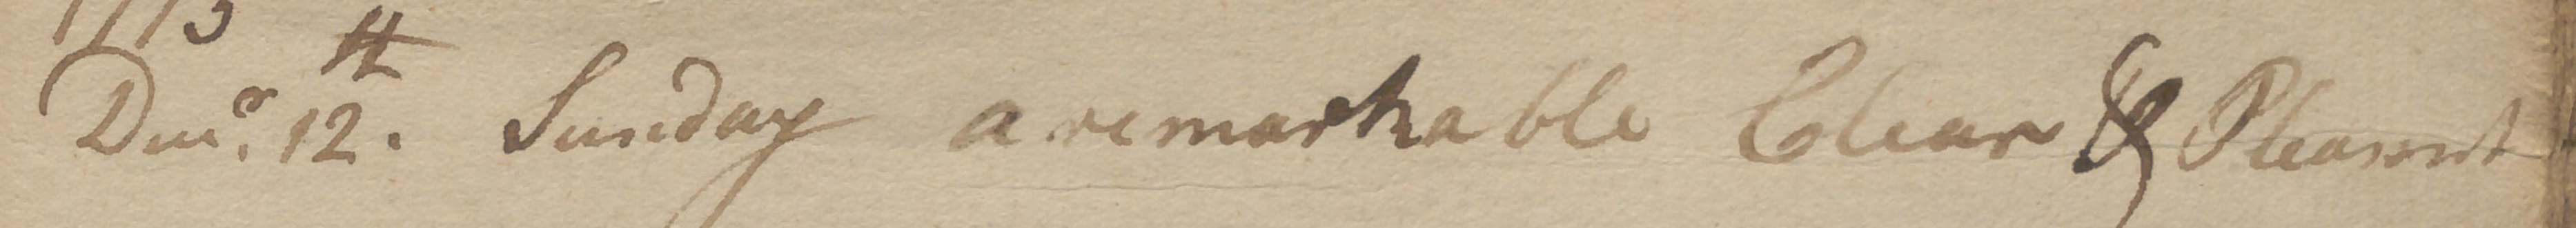Dec^r. 12^th. Sunday a remarkable Clear & Pleasent
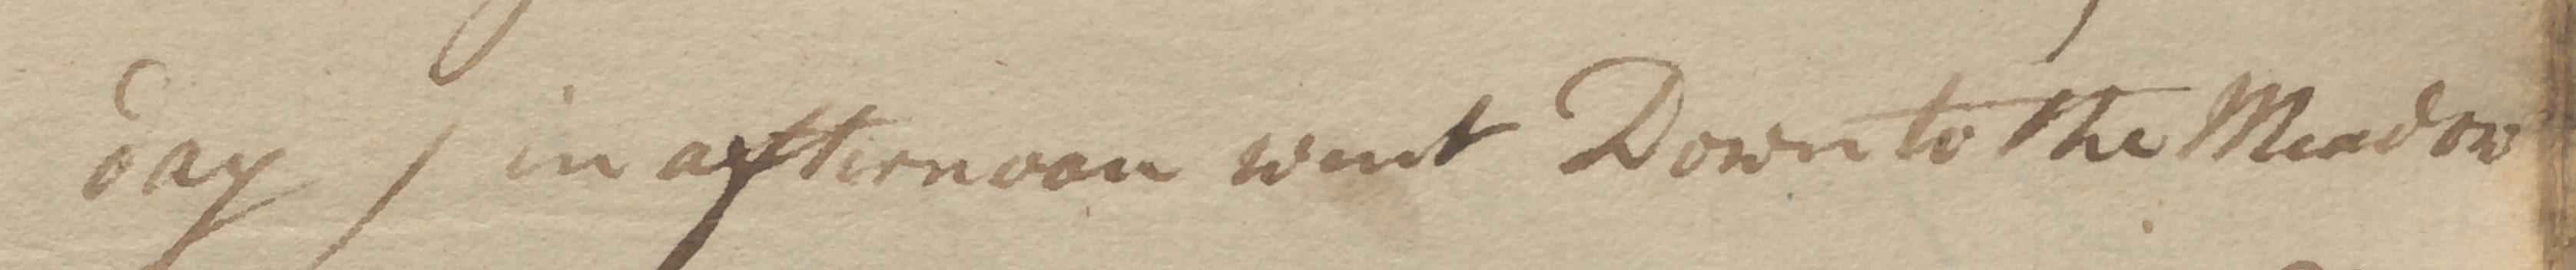day / in afternoon went Down to the Meadow
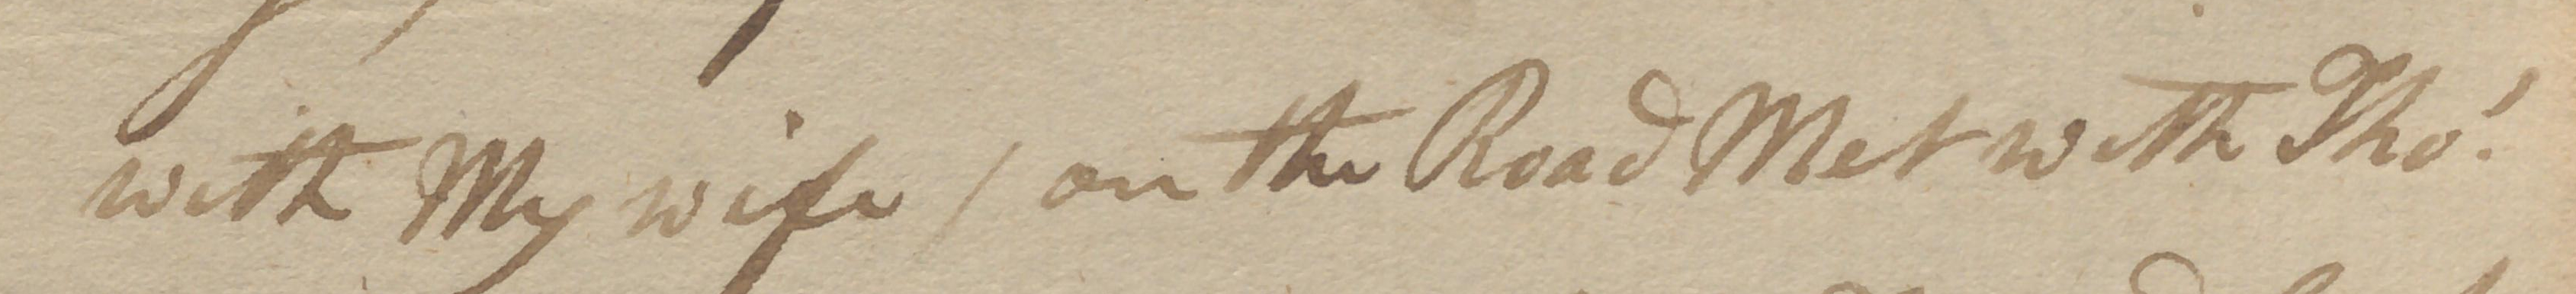with My wife / on the Road Met with Tho^s.
